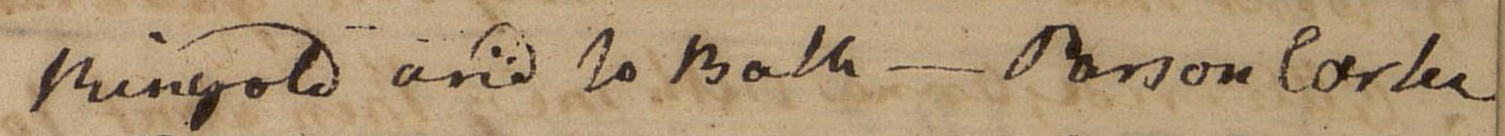Ringold and to Bath- Parson Carter
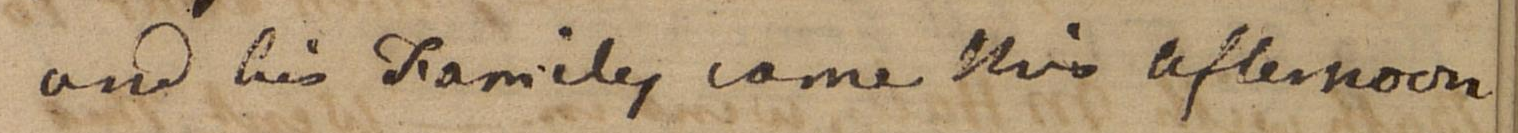and his Family came this afternoon
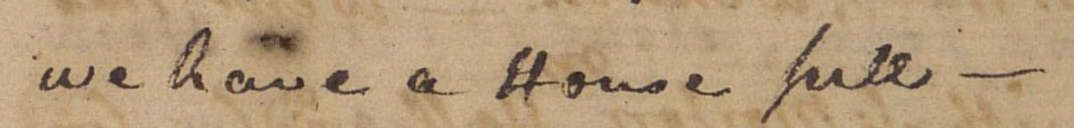we have a House full-
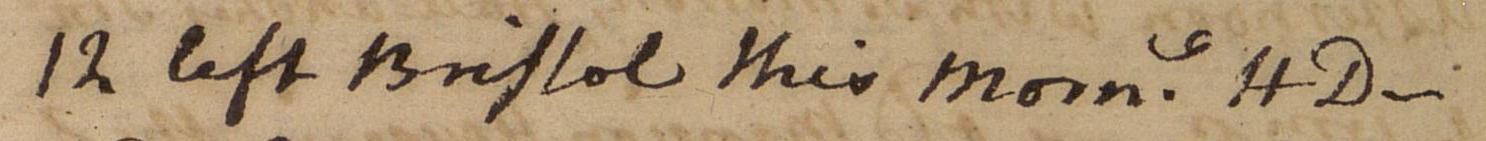12 left Bristol this morn^g. HD-
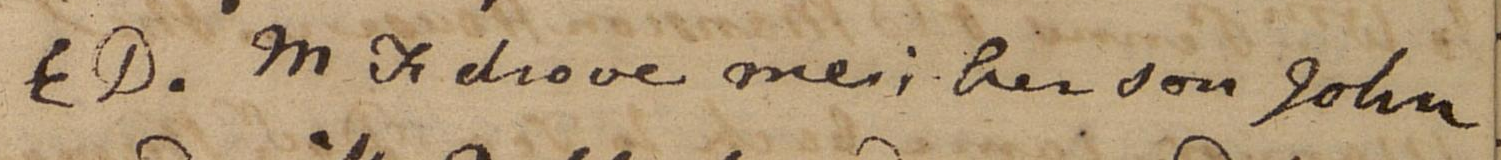ED. M F drove me; her son John
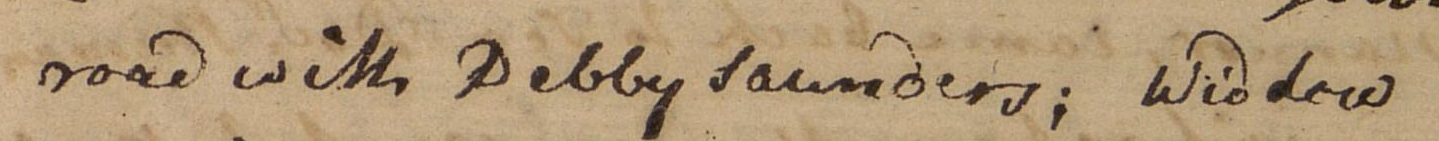road with Debby Saunders; Widdow
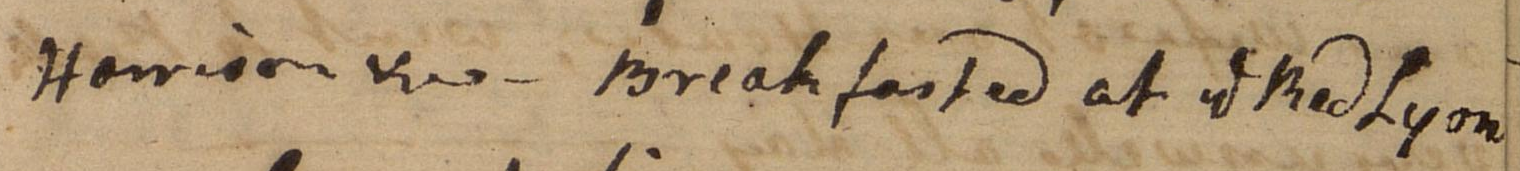Harrison &c - Breakfasted at y^e Red Lyon
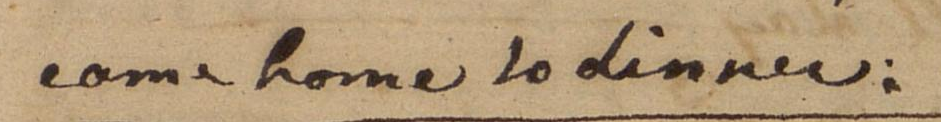came home to dinner:
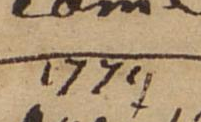1771,
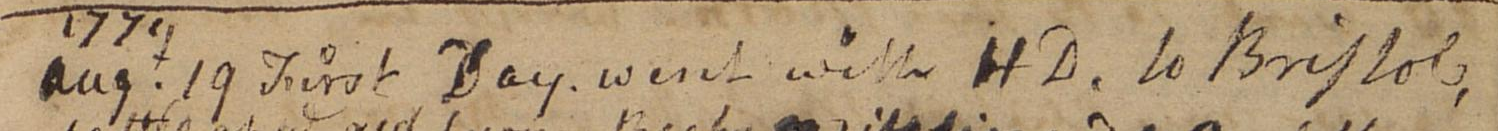Aug^t. 19 First Day. went with HD. to Bristol,
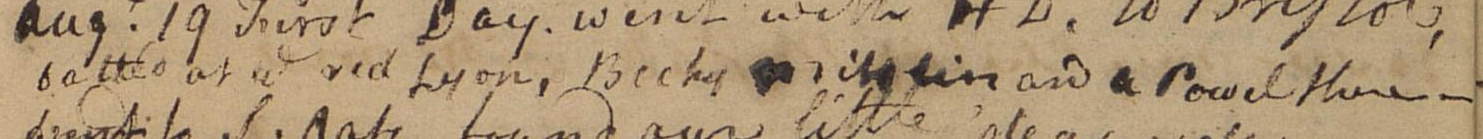batted at y^e red Lyon, Becky [Mifflin] and A Powel there-
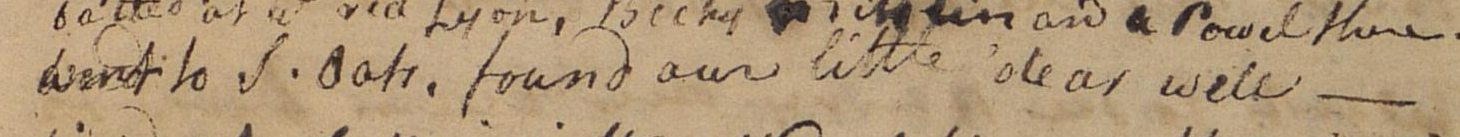went to S. Oats, found our little dear well-
